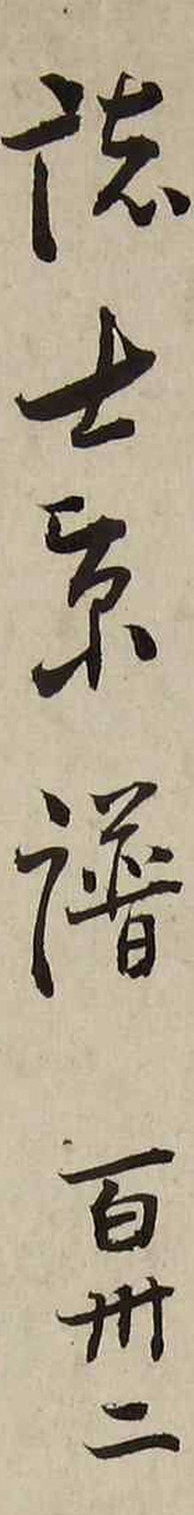諸士系譜百卅二

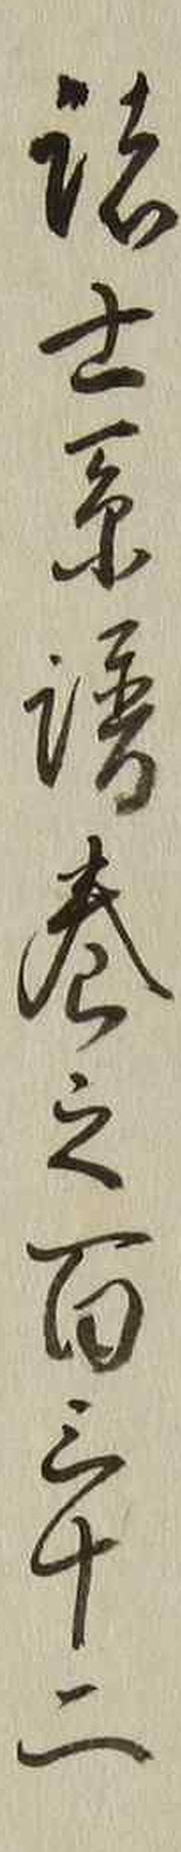諸士系譜巻之百三十二
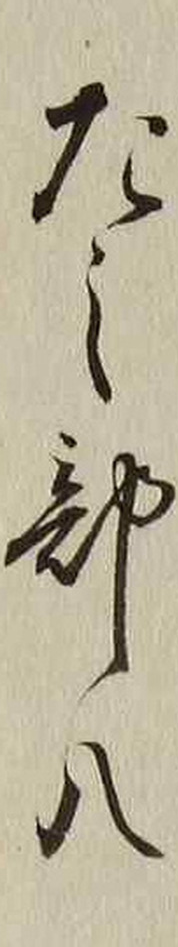た之部八
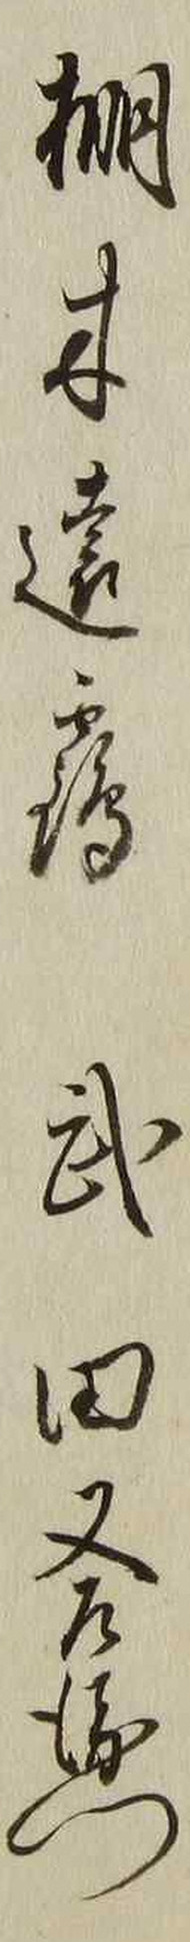棚木遠鶴武田又左衛門
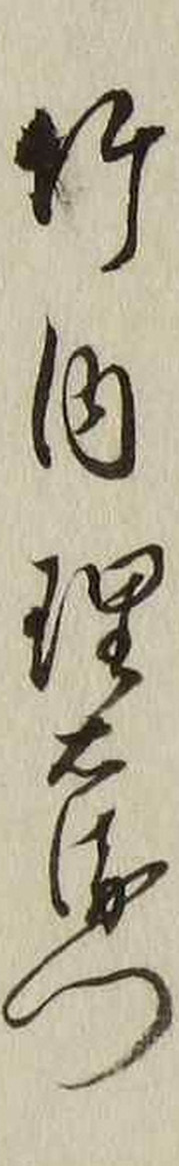竹内理右衛門

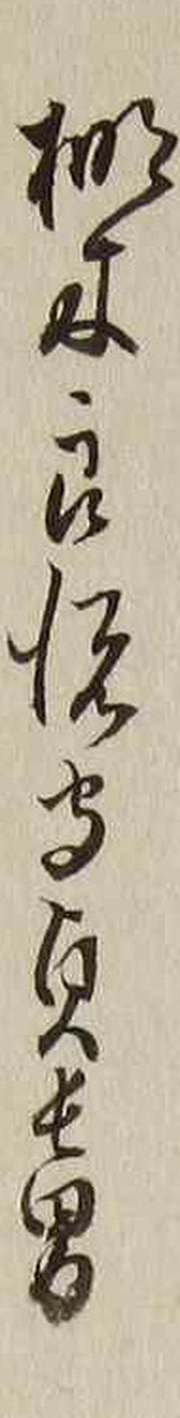棚木良悦守貞長男
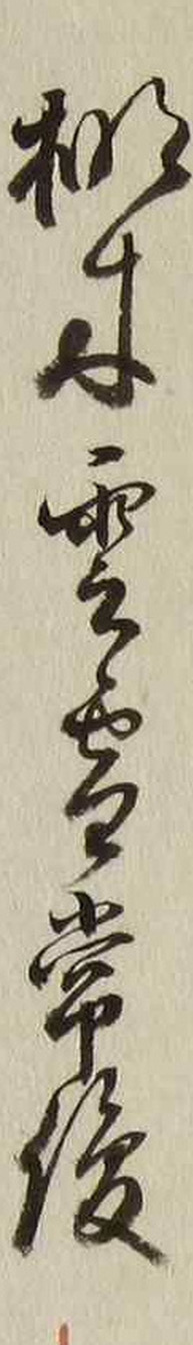棚木雲雪常俊
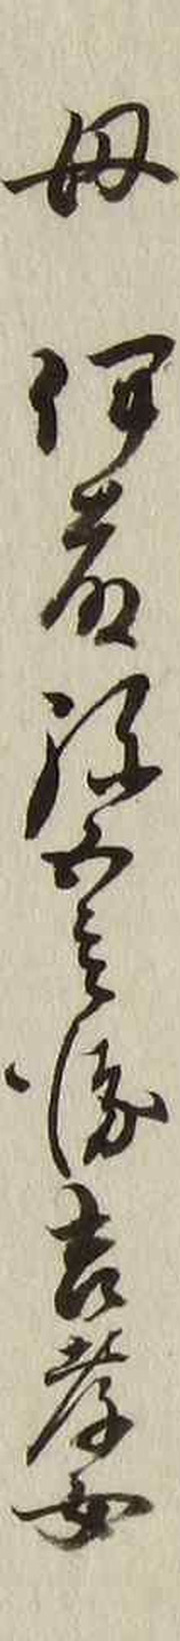母伊藤弥五兵衛吉孝女
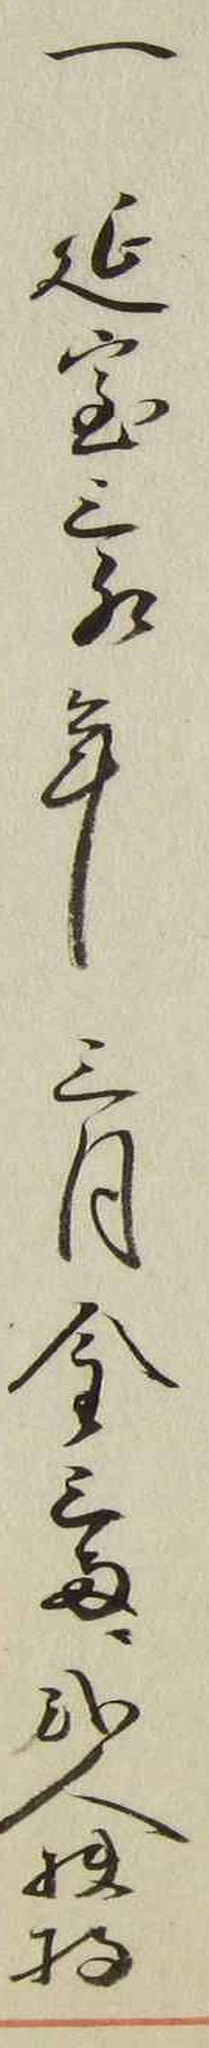一延宝三卯年三月金三両ニ弐人扶持
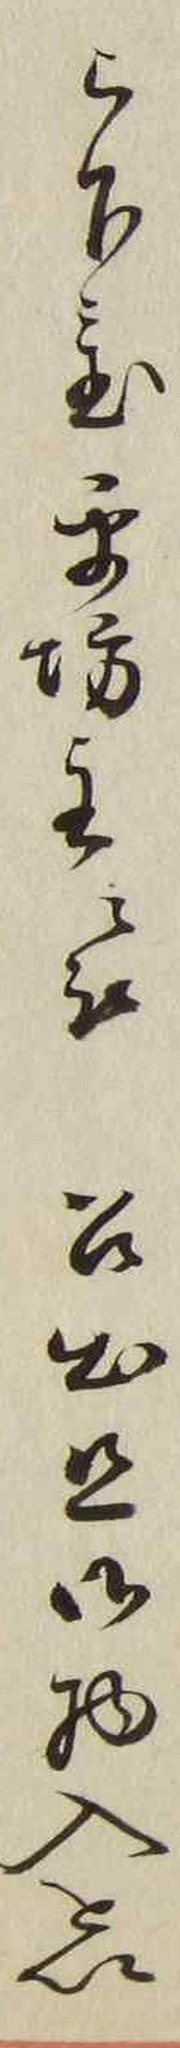被下置平坊主ニ被召出旦御物入を以

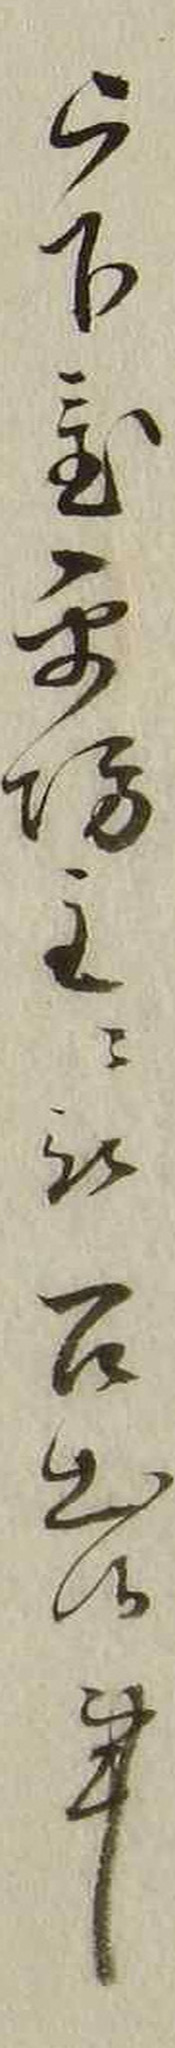被下置平坊主ニ被召出候事
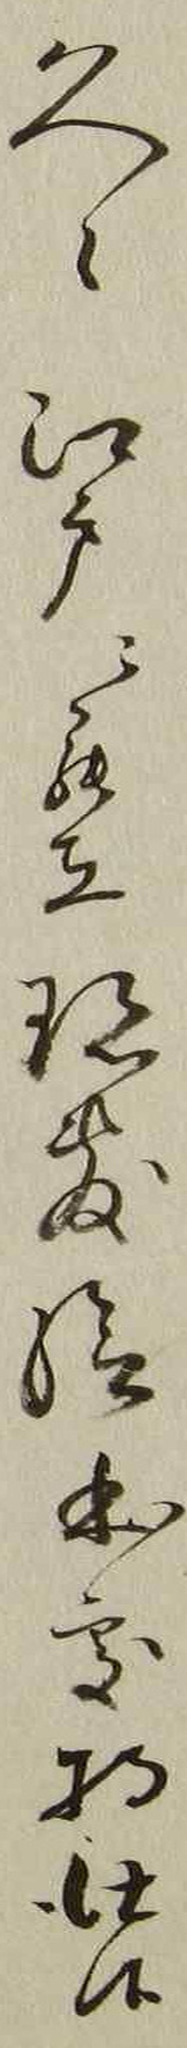久々江戸ニ罷在珍敷絵本処持仕候
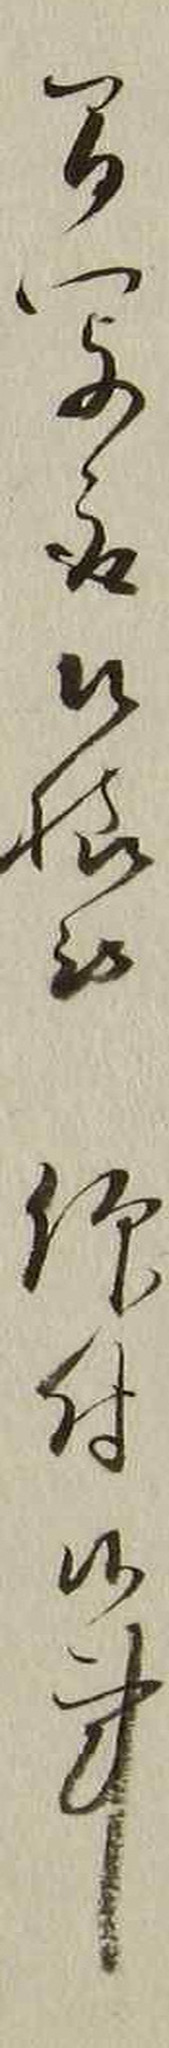間写取候様被仰付事候
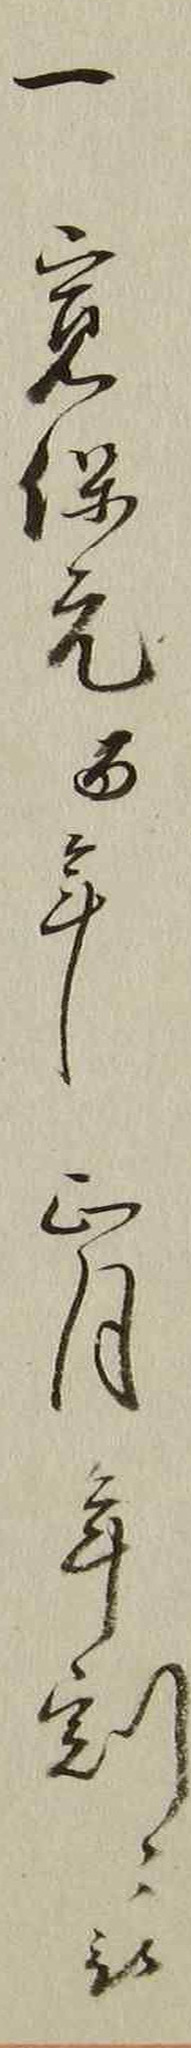一寛保元酉年正月年割ニ被
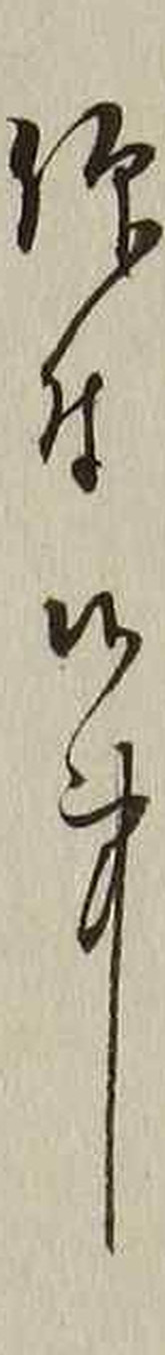仰付候事
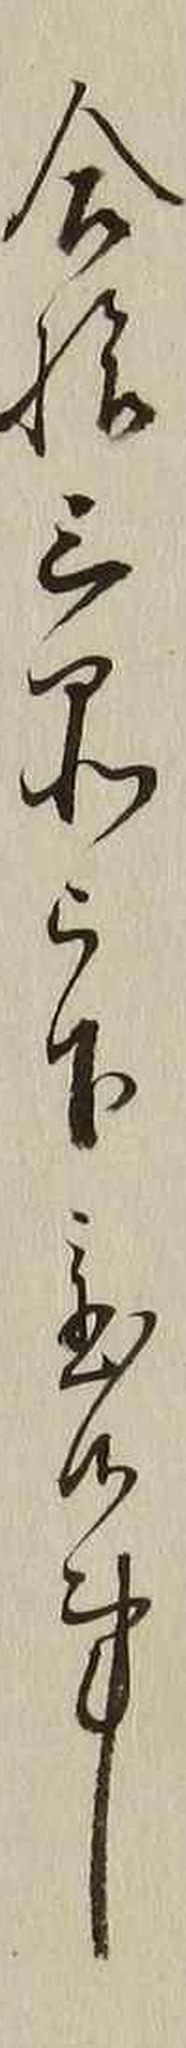合拾三品被下置候事
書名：諸士系譜　巻之132　た之部8
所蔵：会津若松市立会津図書館
